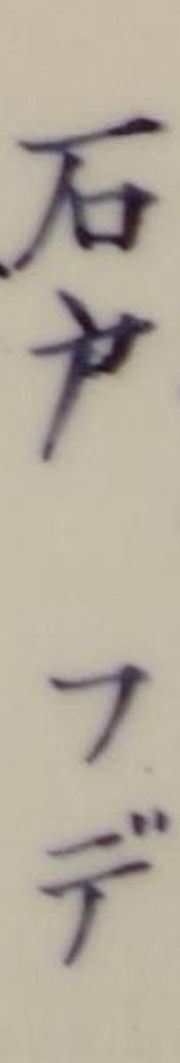石戸フデ
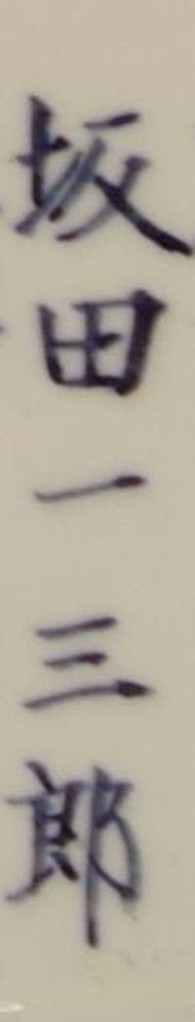坂田一三郎
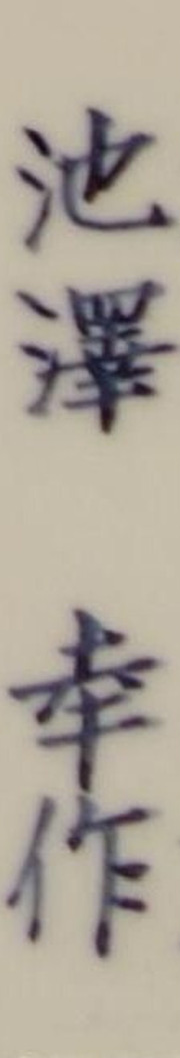池澤幸作
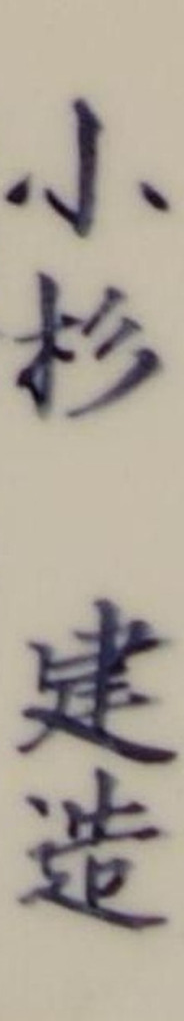小杉建造
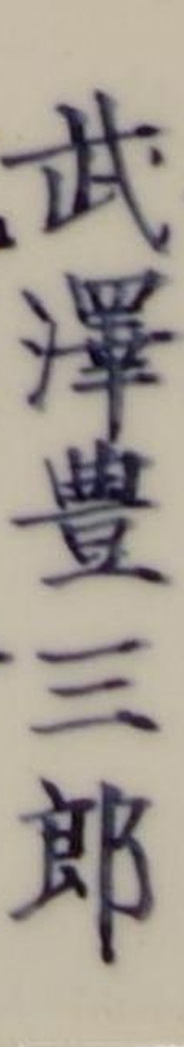武澤豊三郎
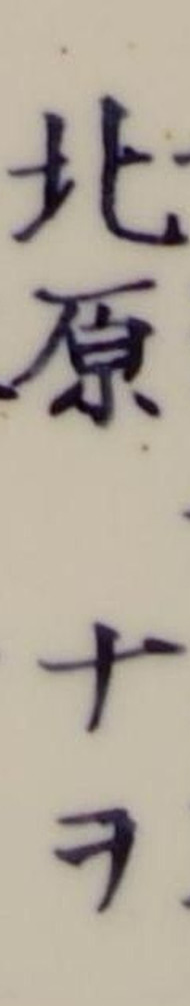北原ナヲ
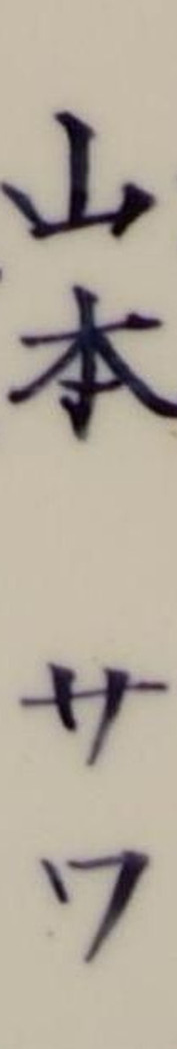山本サワ
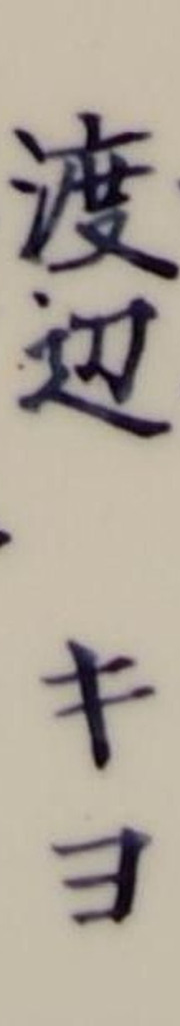渡辺キヨ
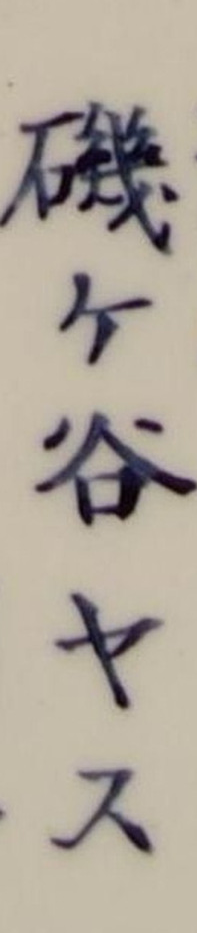磯ケ谷ヤス
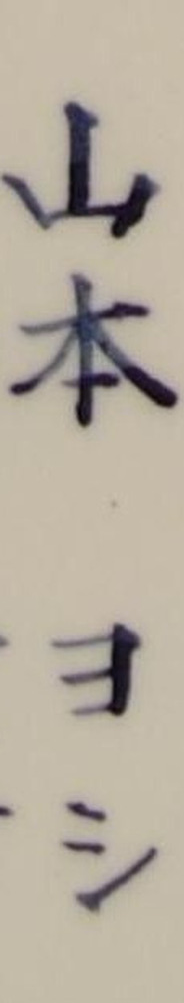山本ヨシ
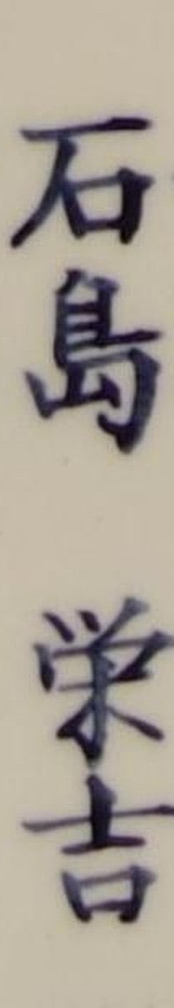石島栄吉
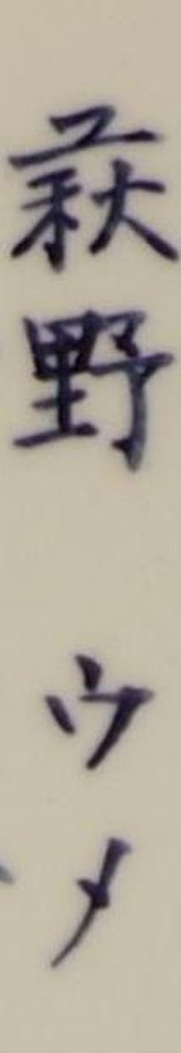萩野ウメ
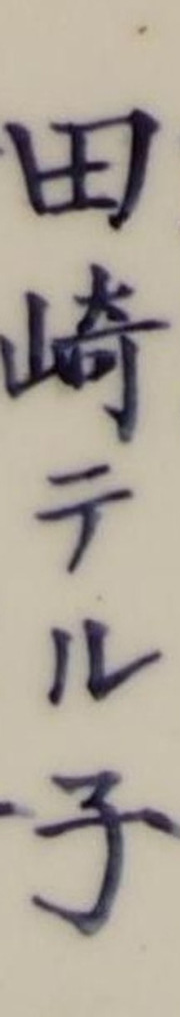田崎テル子
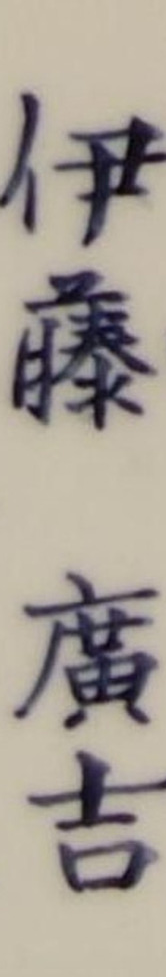伊藤広吉
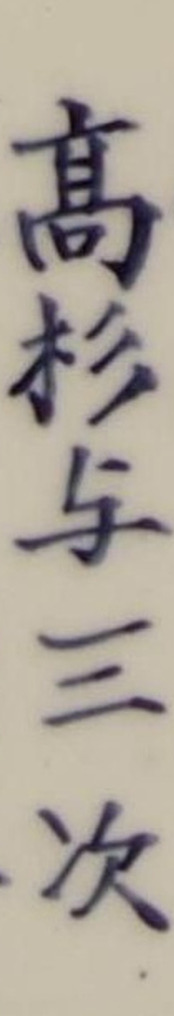高杉与三次
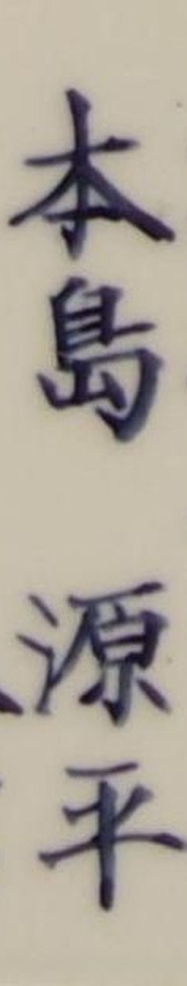本島源平
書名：E~L
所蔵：高野山金剛峯寺
